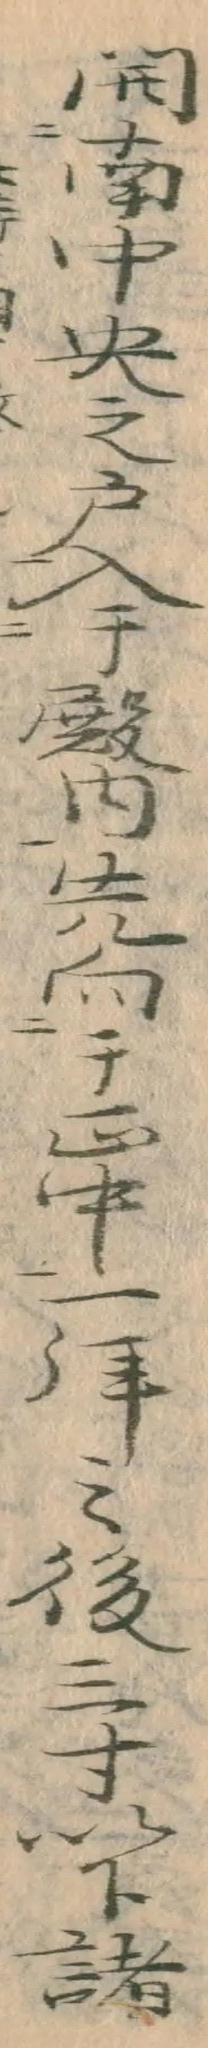開南中央之戸入于殿内先向于正中一拝之後三寸以下諸

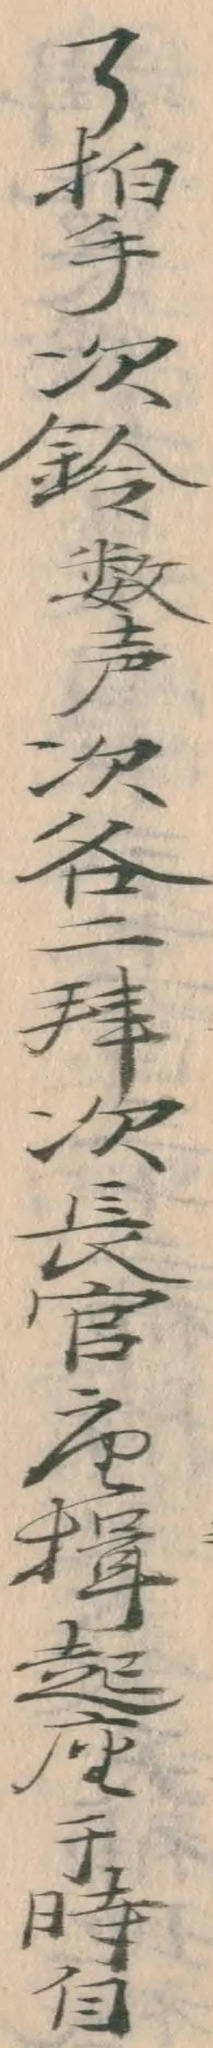了拍手次鈴数声次各二拝次長官座揖起座于時自
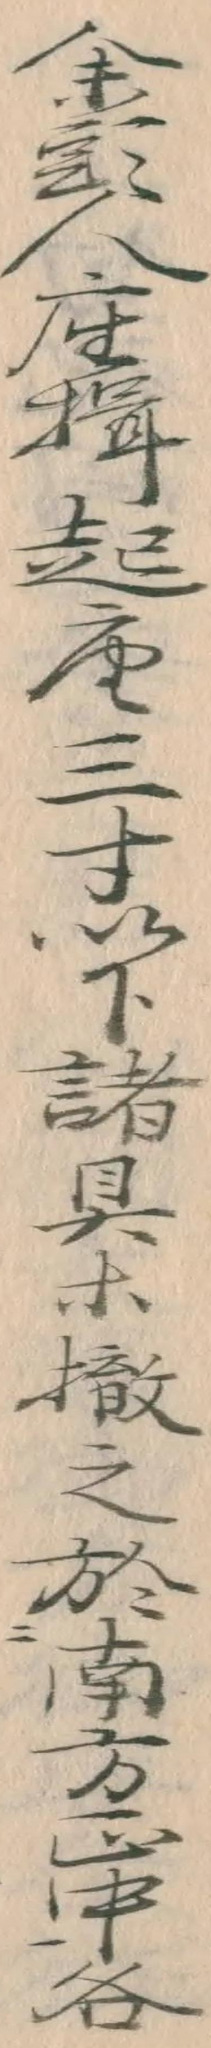余頭人座揖起座三寸以下諸具等撒之於南方正中各
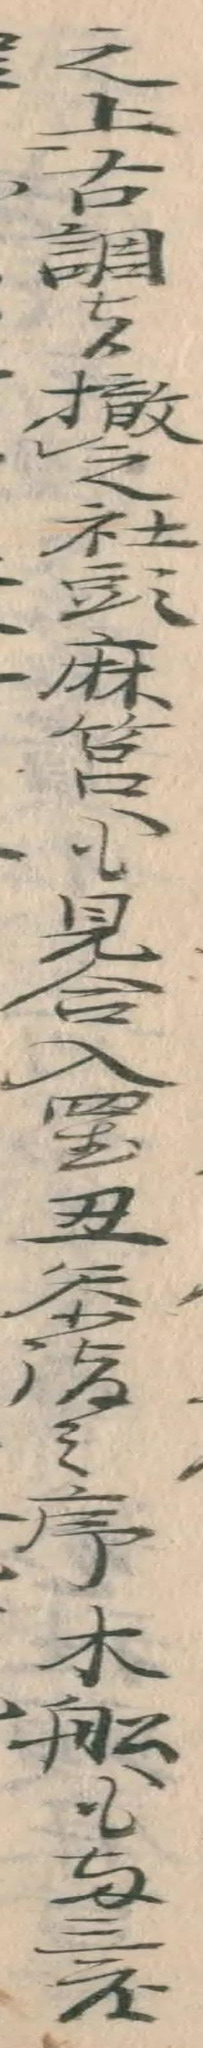之上古調者撒之社頭麻筥へも見合入置丑参詣之序木舩へも両三度
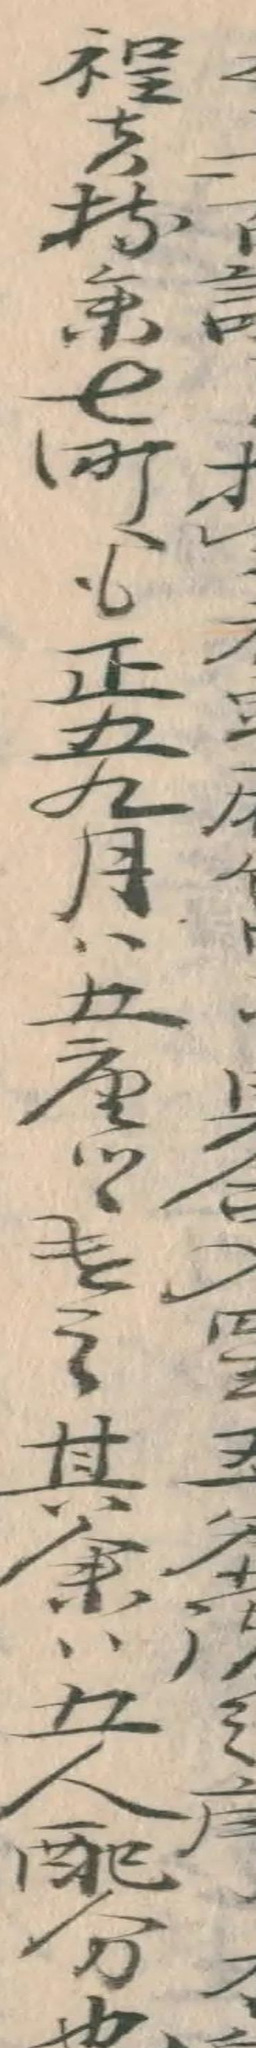程者持参七町へも正五九月ハ五座ツヽ遣之其余ハ五人配分也
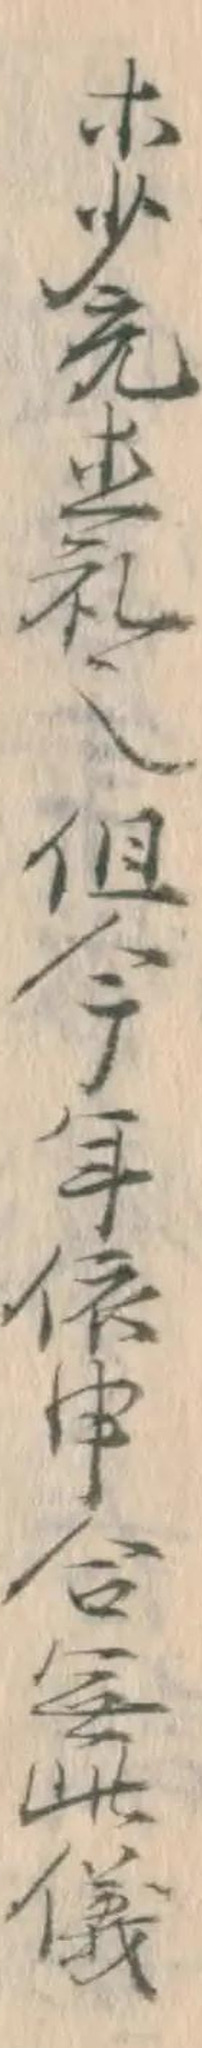等少充直礼也但今年依申合無此儀
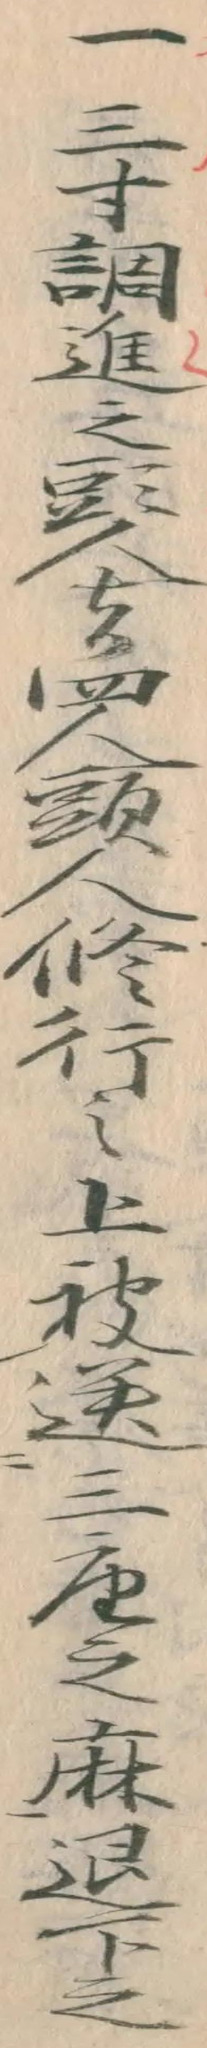一三寸調進之頭人者四人頭人修行之上被送三座之麻退下之

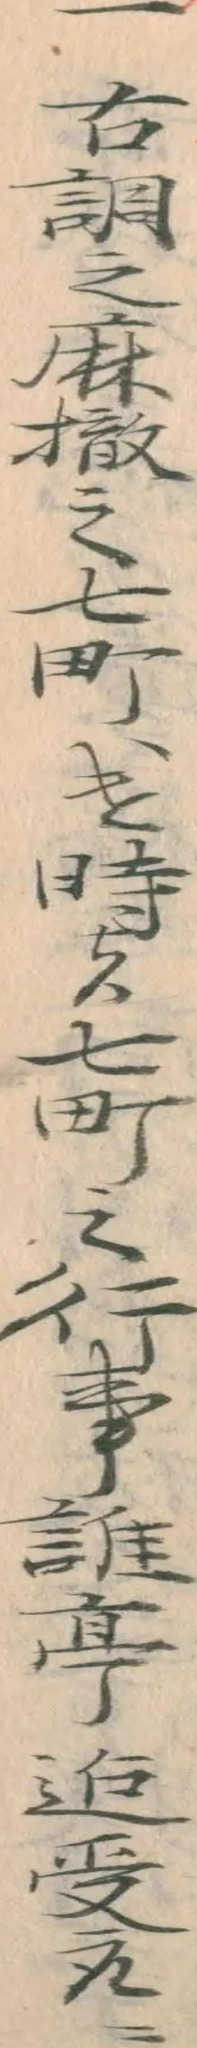一古調之麻撒之七町へ遣時旨七町之行事誰亭迄受取ニ
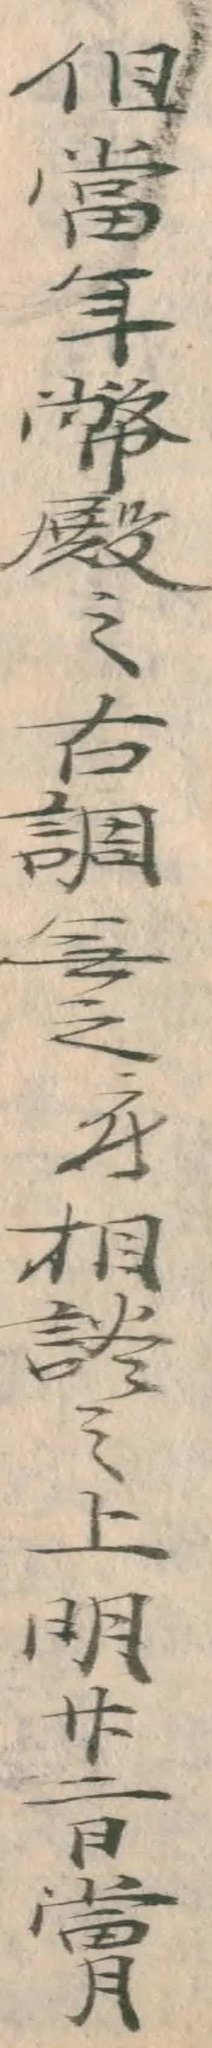但當年幣殿之古調無之ニ付相談之上明廿二日當月
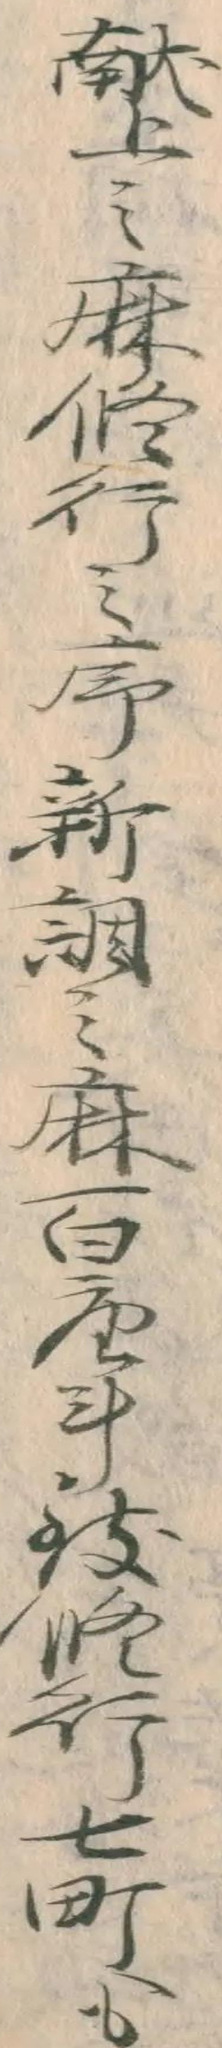献上之麻修行之序新調之麻百座斗致修行七町へも
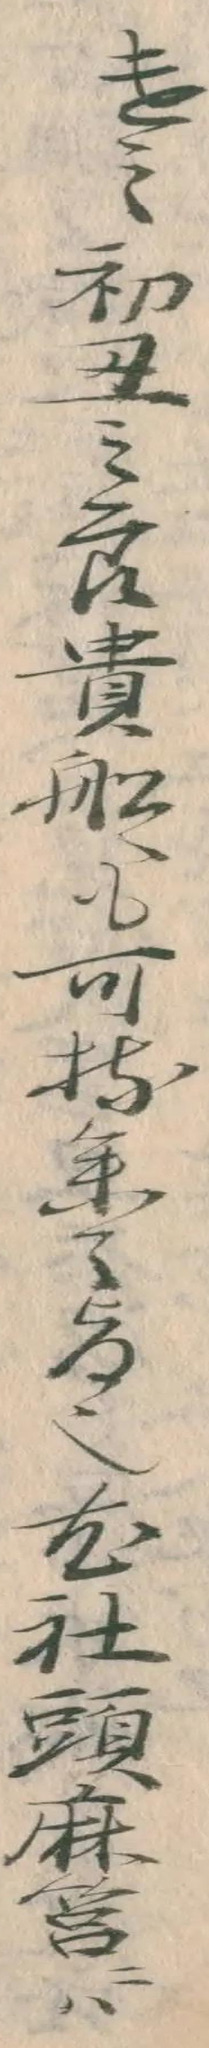遣之初丑之節貴舩へも可持参之旨也尤社頭麻筥ニハ
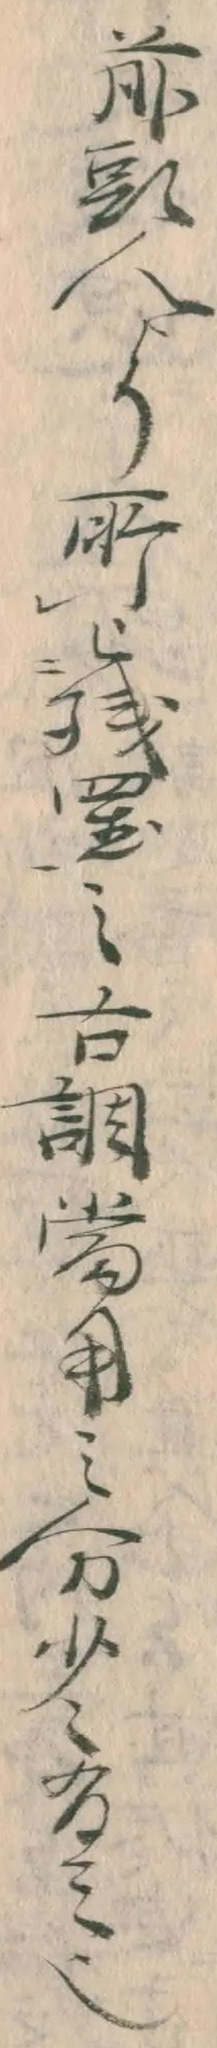前頭人より所被残置之古調當用之分少々有之也
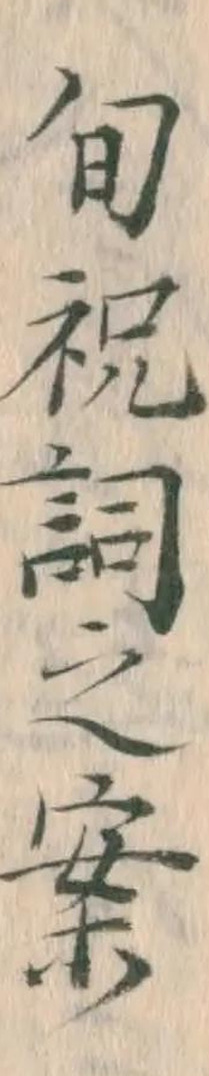旬祝詞之案
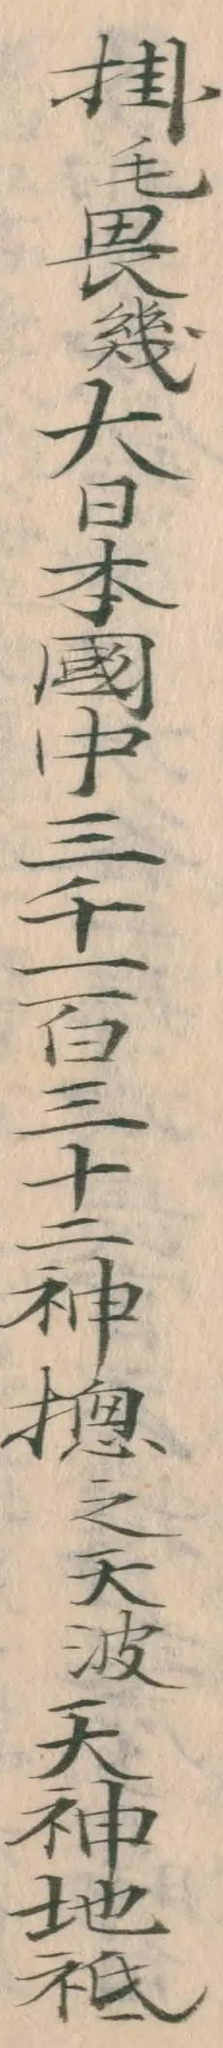掛毛畏幾大日本國中三千一百三十二神摠之天波天神地祇
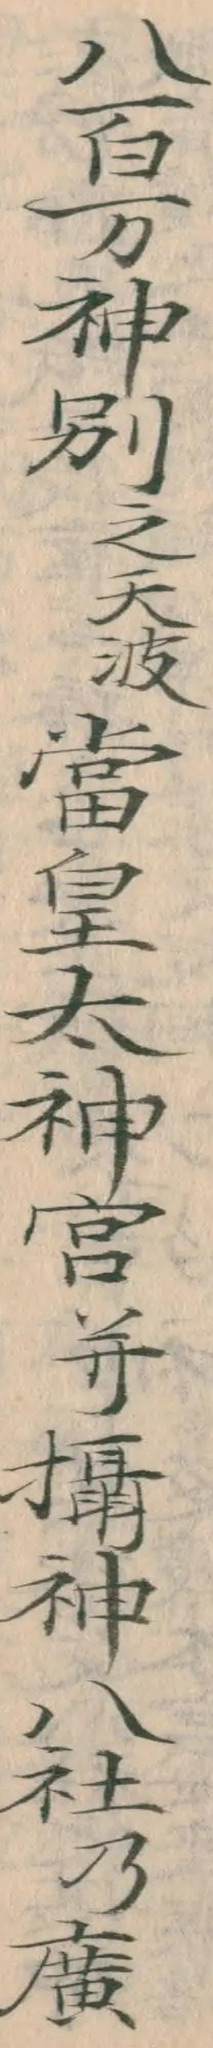八百万神別之大波當皇太神宮幷摂神八社乃廣
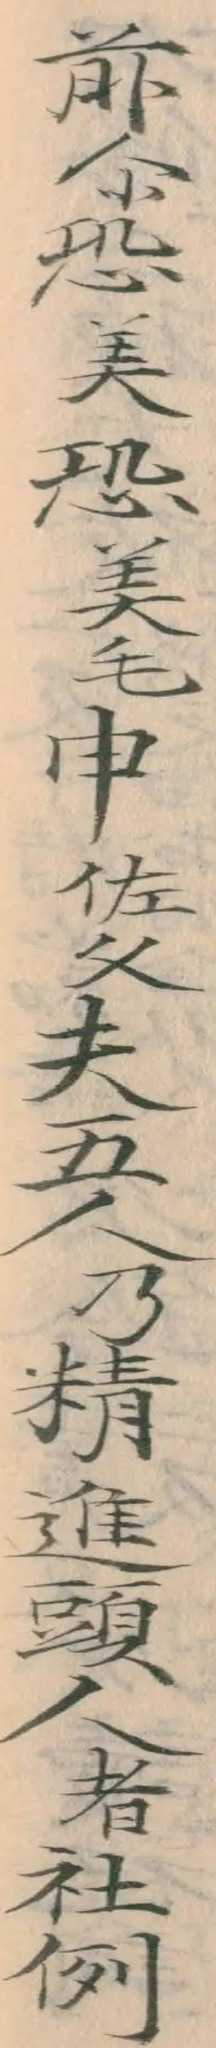前尒恐美恐美毛申佐久夫五人乃精進頭人者社例
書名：賀茂社記録. 第72冊
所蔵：国立国会図書館 National Diet Library, JAPAN
